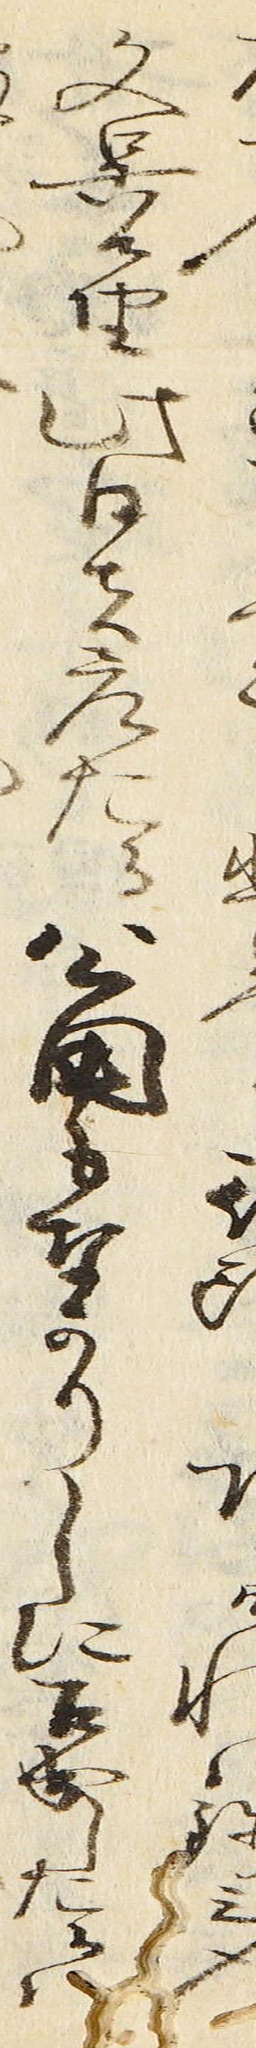文呉候由此日は差たる公用もなかりしに召出したるハ
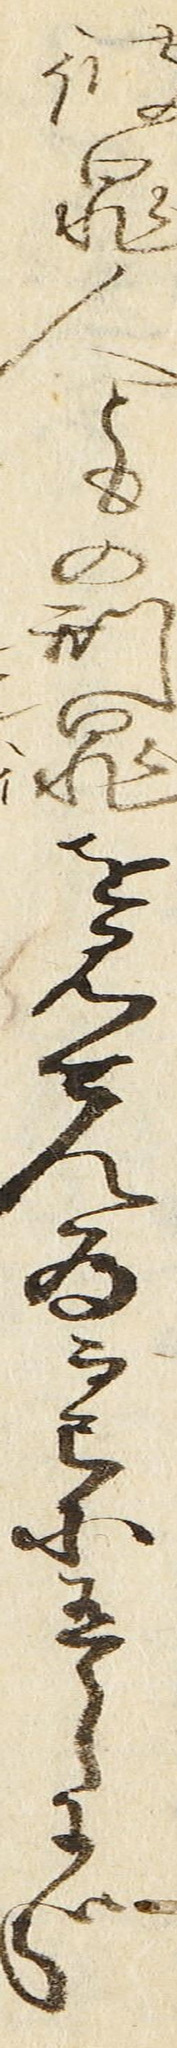彼罪人ともの刑罪を見せん為而已に有之に哉
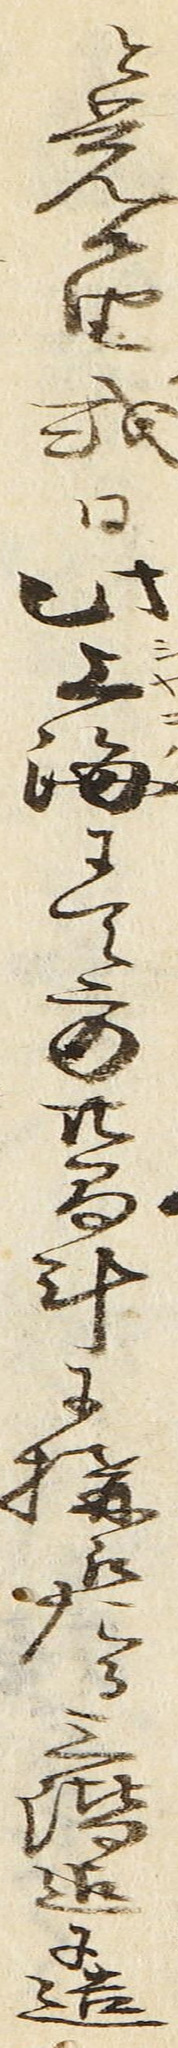と覚候由或は此上海にて方廿間計に構えたる三階迄に造
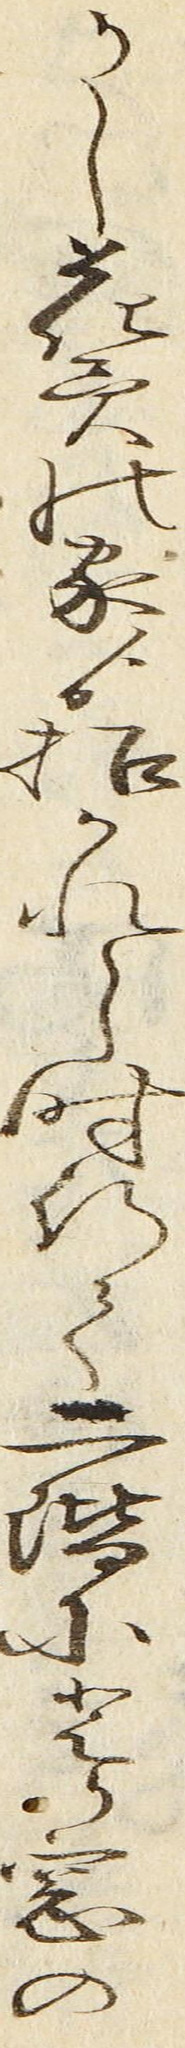りし花美の家ゟ招かれし時行て二階に登り窓の
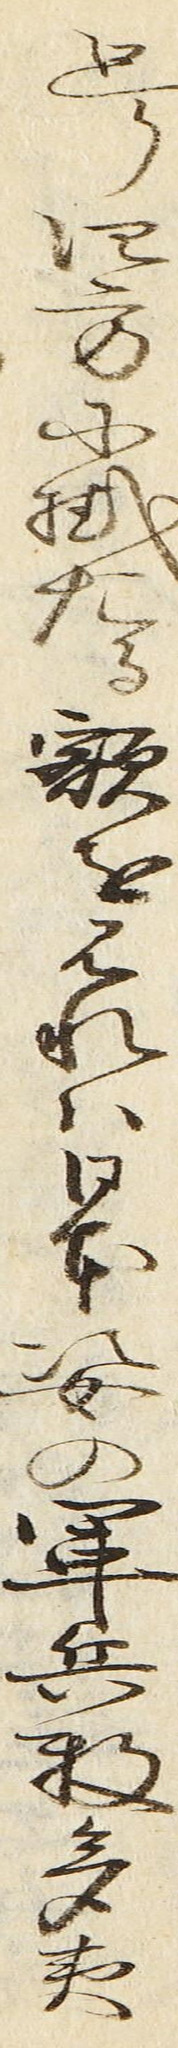廻り四方に掛たる額を見れハ日本姿の軍兵数多夷
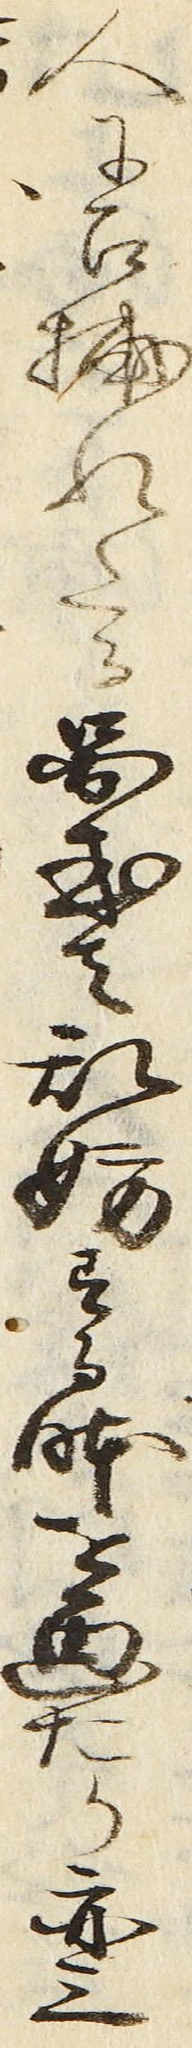人に召捕れたる図本は乱妨する日本を画たり亦三
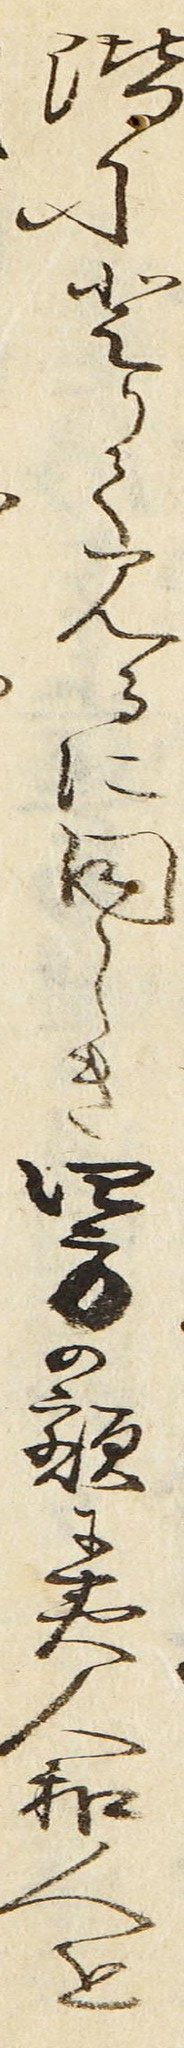階に登りて見るに同しき四方の額に夷人和人を
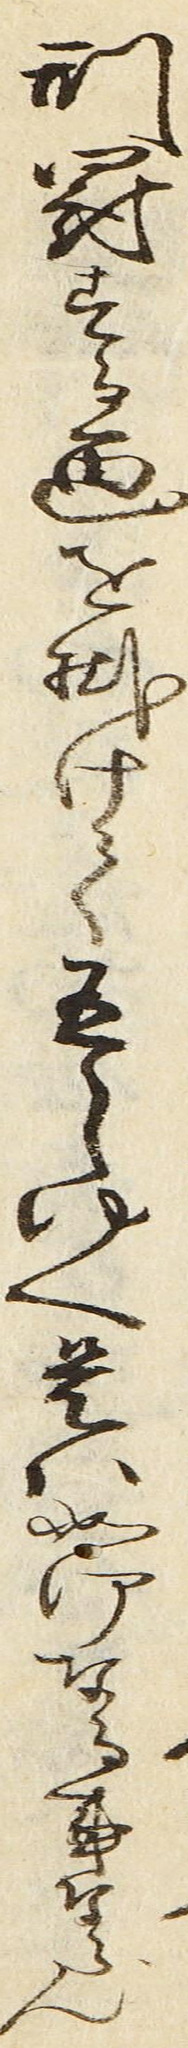刑罰する画を掛けて有しゆへ是ハ如何なる事ならん
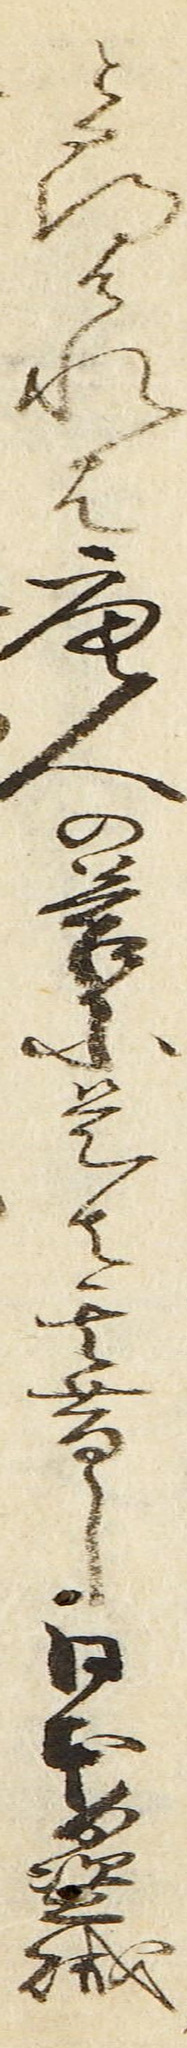と尋けれは唐人の答に是は其昔し日本ゟ盗賊
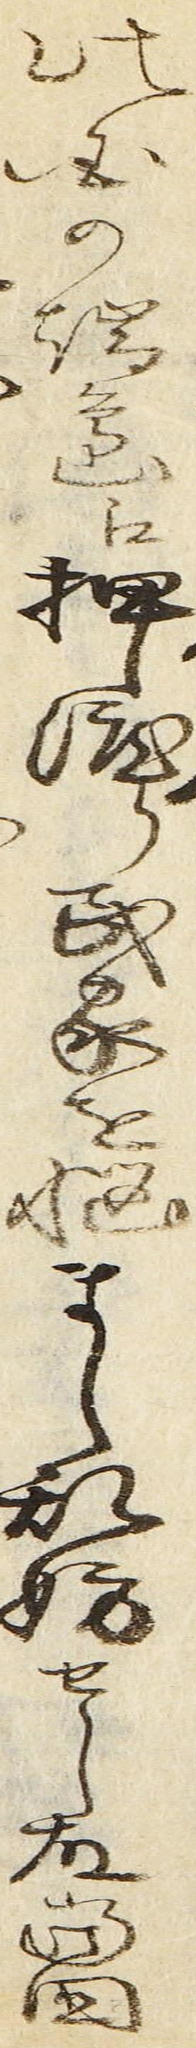此国の端島え押渡り民家を悩まし乱妨セし故当国
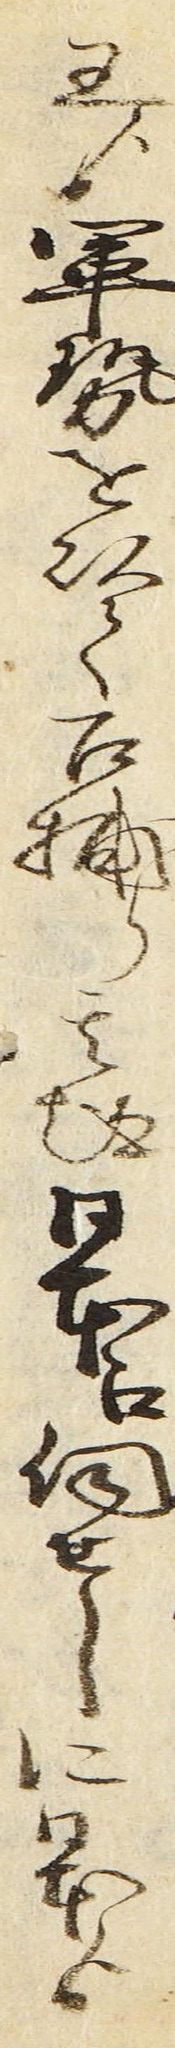王ゟ軍勢を以て召捕り其趣日本え伺せしに日本ゟ

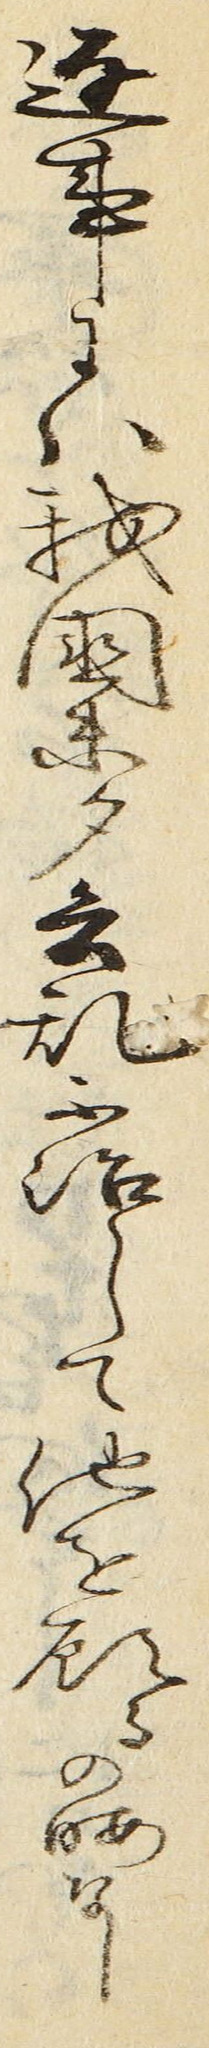返事にハ我国未タ兵乱不治して他を顧るの暇なし
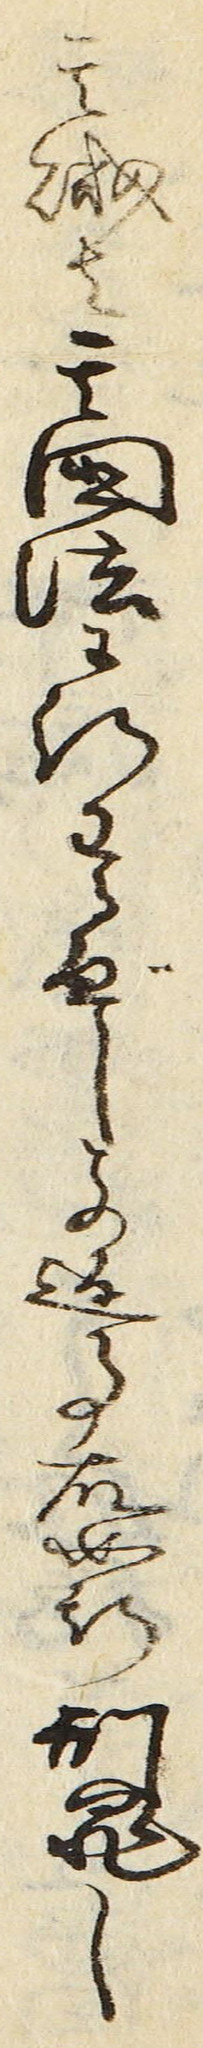其賊は其国法に行わるべしとの返事故如斯刑罪し
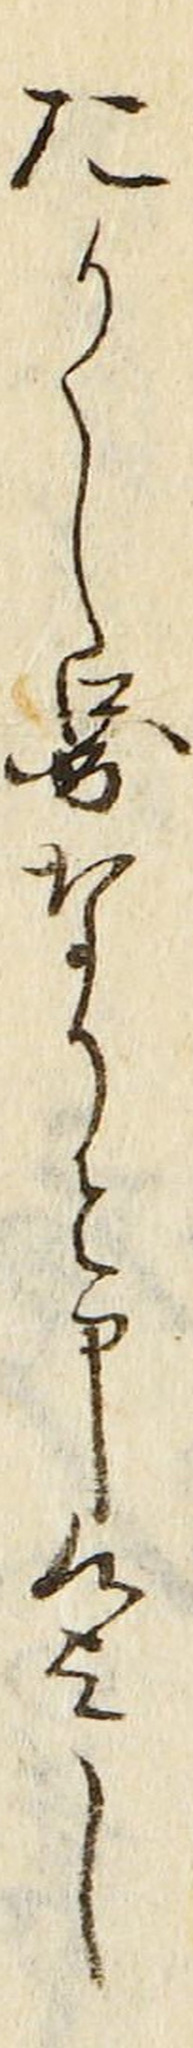たりし図なりと申候よし
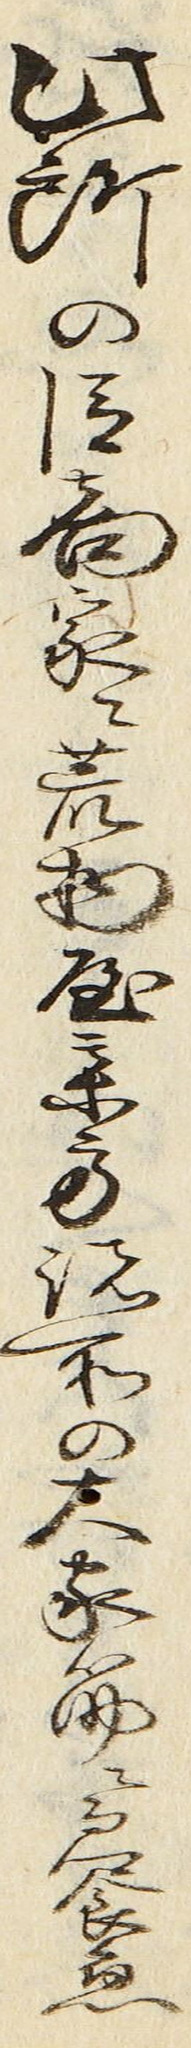此所の臣商家ニ荒物屋某方諸所の大家筋ニ而饗応
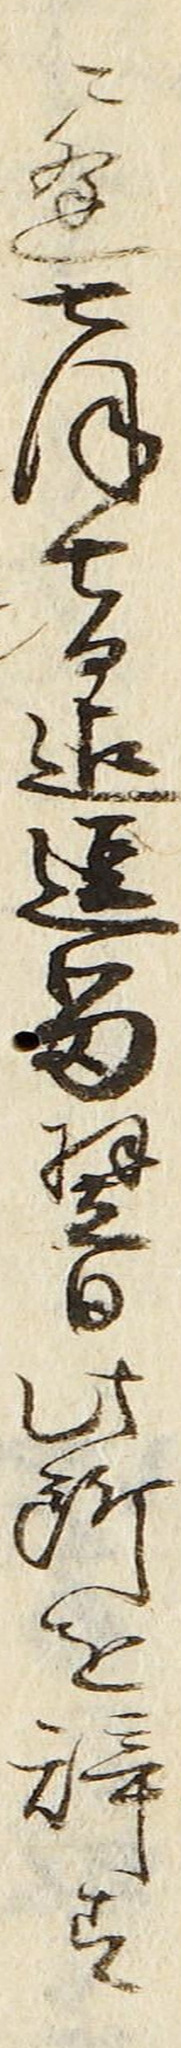ニ逢七月七日迄逗留翌日此所を辞す
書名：亜墨利加漂流記聞
